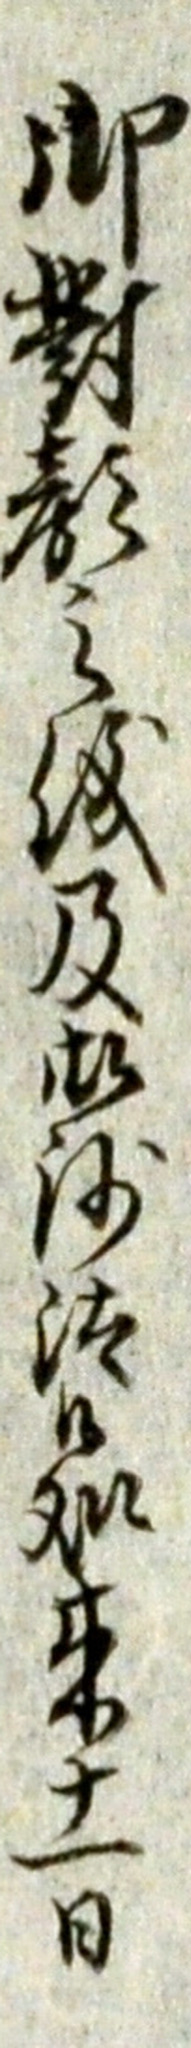御対顔之儀及御沙汰候処来十一日
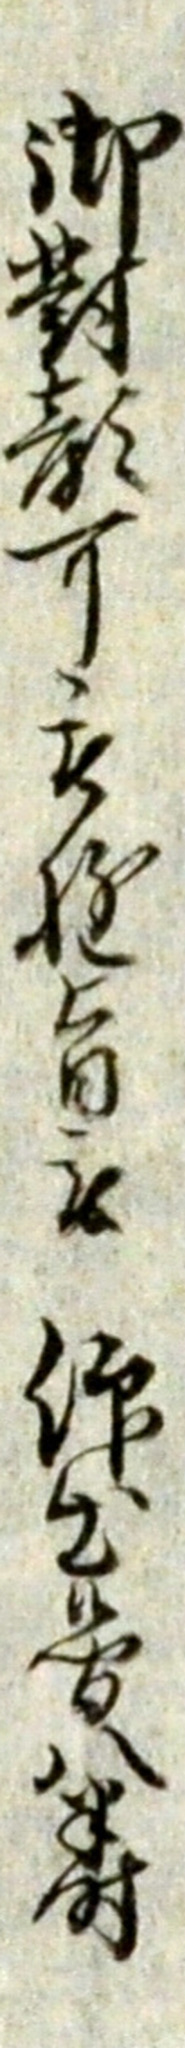御対顔可被遊旨被仰出候間八半時
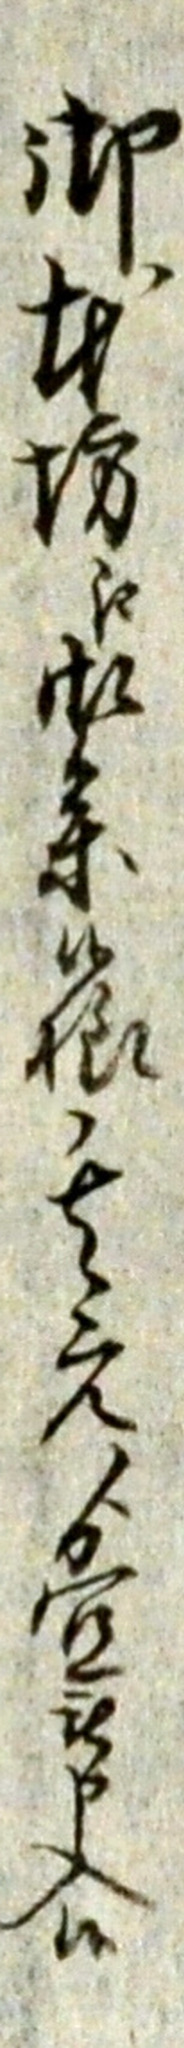御本坊江御参候様其元ゟ宜被申入候
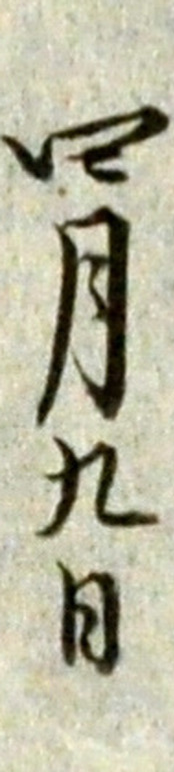四月九日
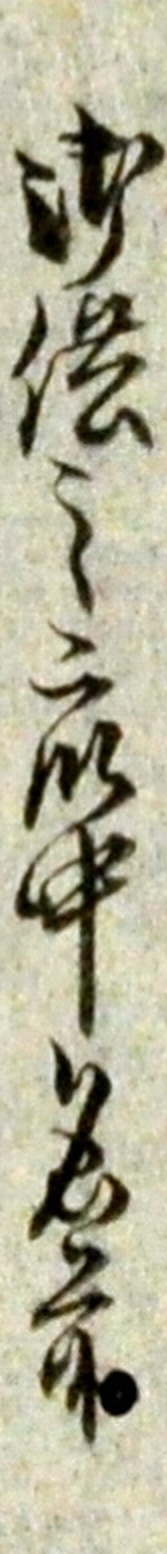御供之衆中名前
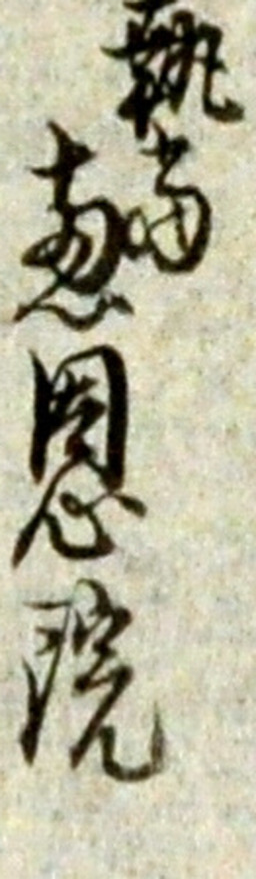恵恩院
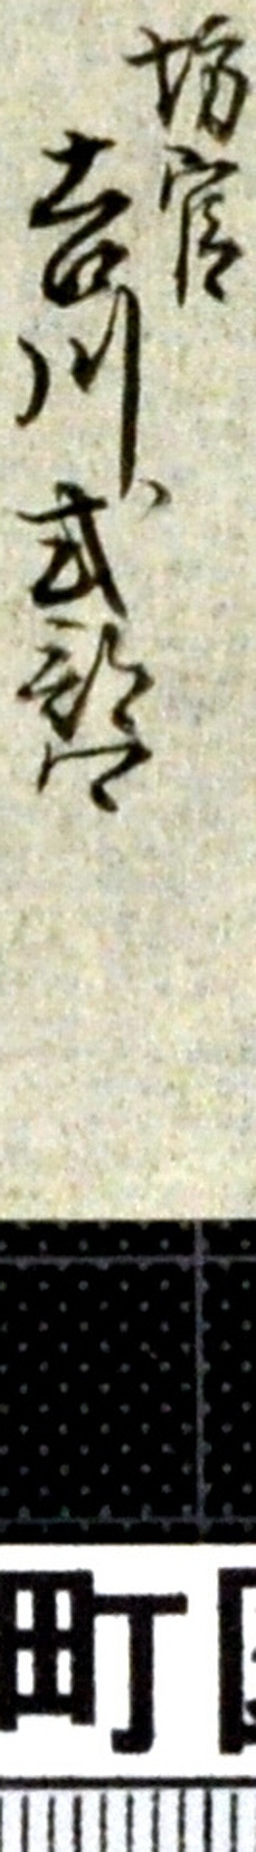吉川式部卿
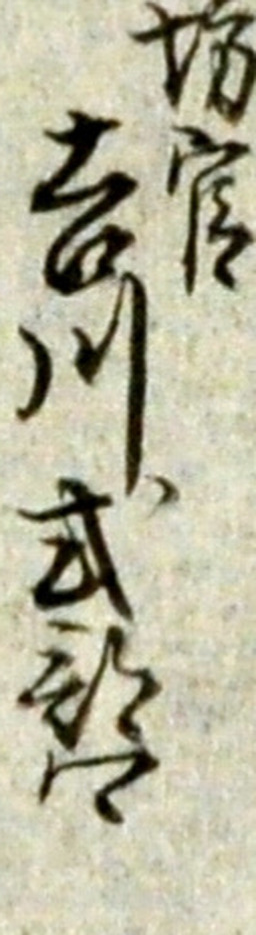吉川式部卿
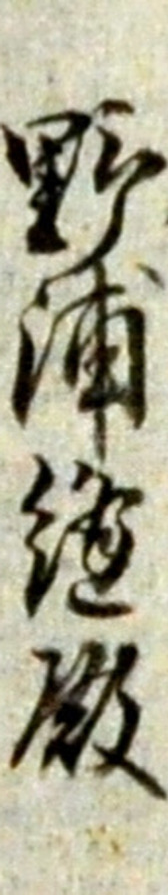野浦縫殿
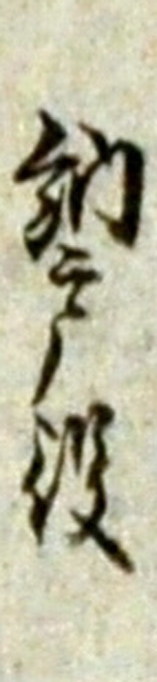納戸役
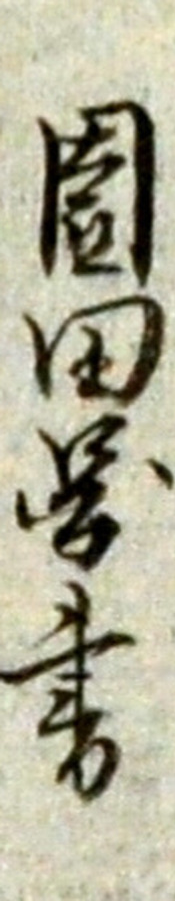園田図書
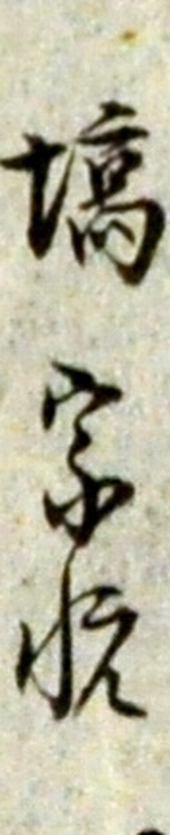塙宗悦
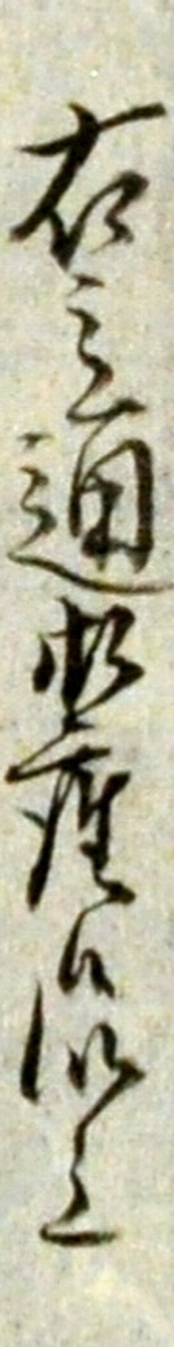右之通御座候以上

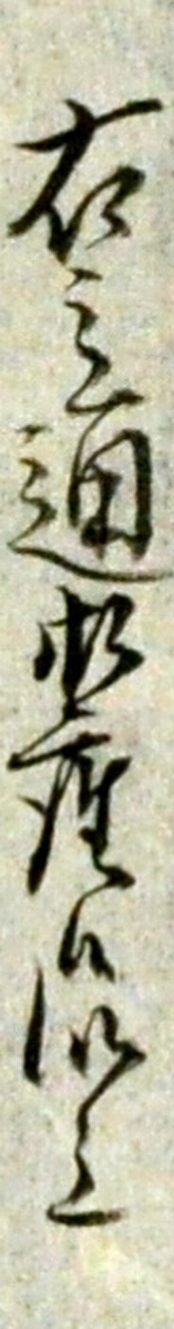右之通御座候以上
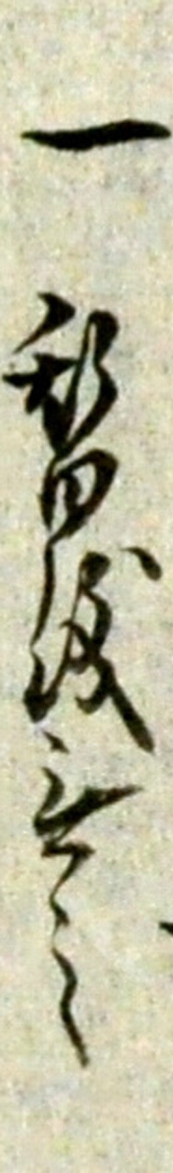一替儀無之
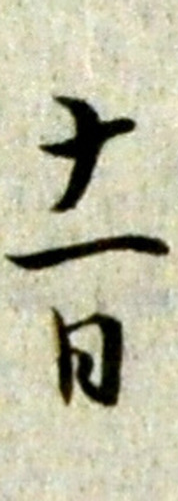十一日
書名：日光御名代相勤候節ノ留
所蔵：伊那市立高遠町図書館・合同会社AMANE
